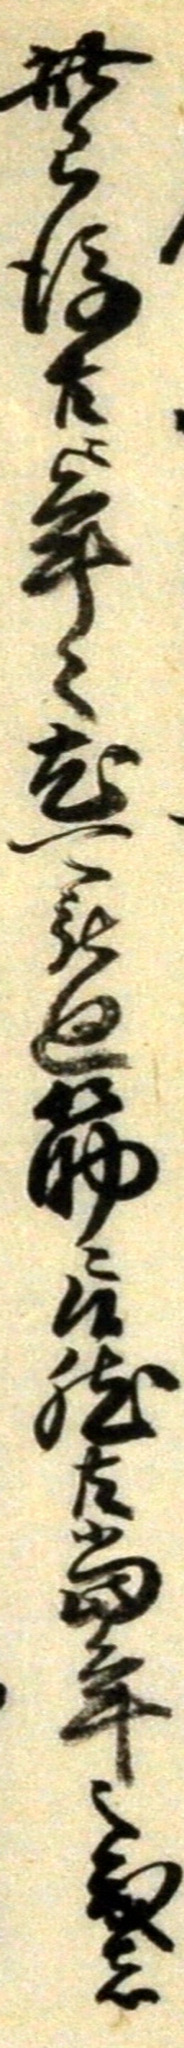此以後共ニ年々尤可被廻筋候然共当年之義者
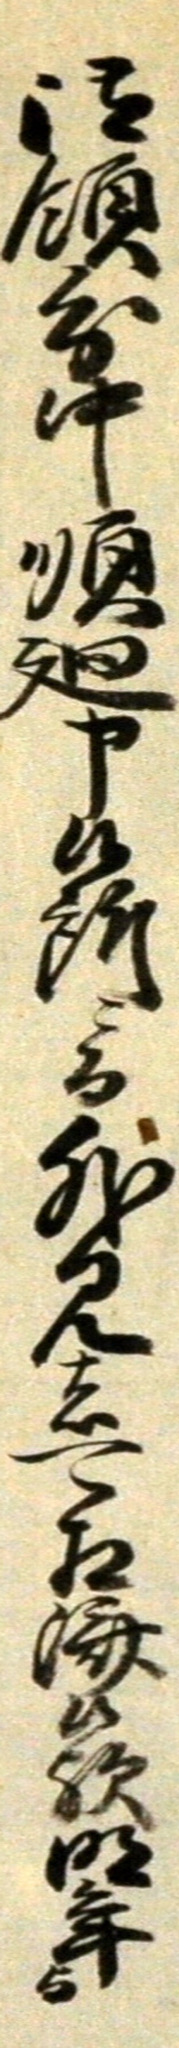御領分中順廻申候所ニ而外見者可相済候歟明年と
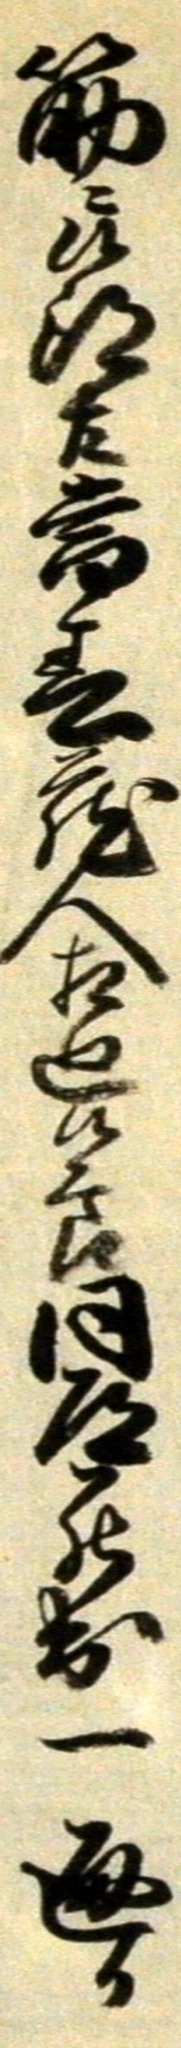筋ニ候得共当春蔵人相廻候節同道罷出一通り
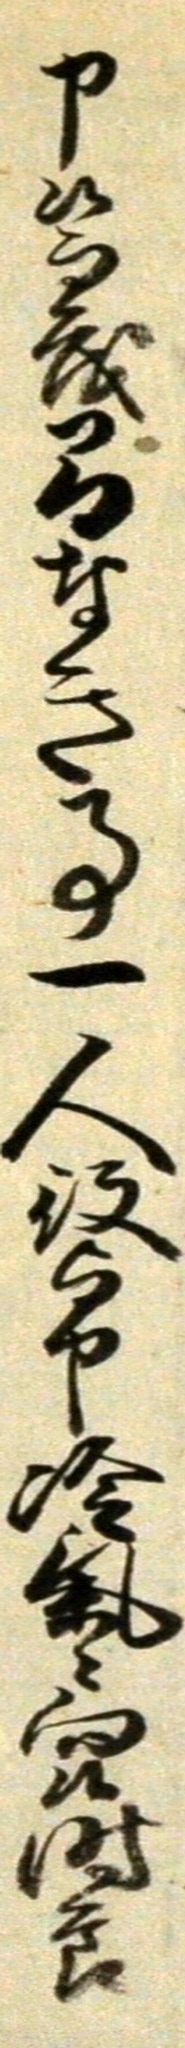申候而茂間なき事一人役と申冷気ニ向候時節
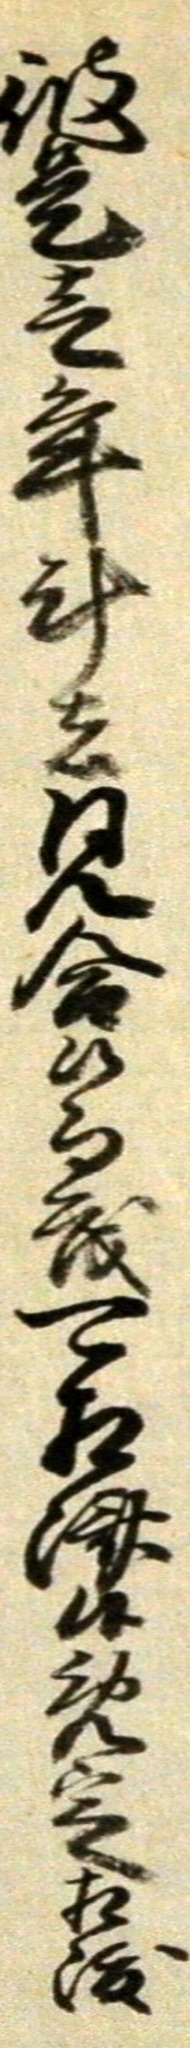彼是壱年斗者見合候而茂可相済候免定相渡
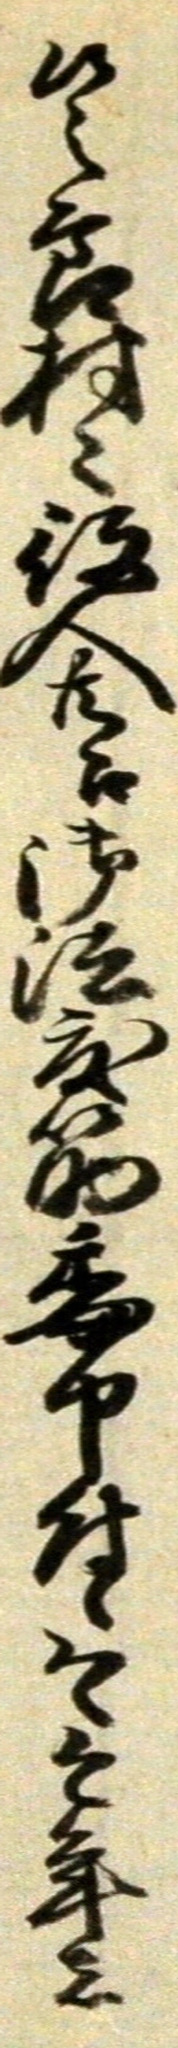候之節村々役人共江御法度筋委申付候ハヽ今年者
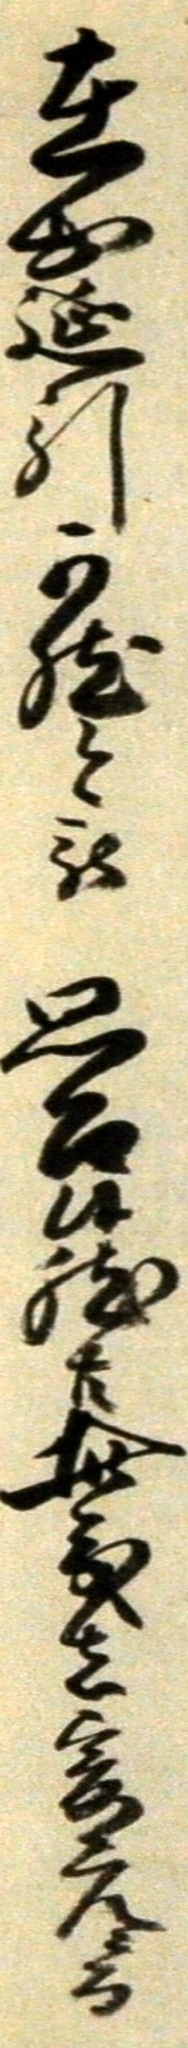在出延引可然と被思召候然共此義者爰元ニ而
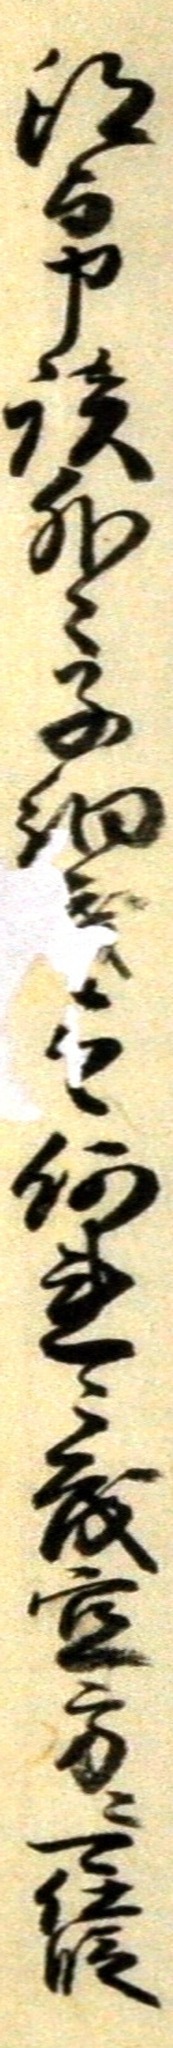得と申談外々子細ハヽ何れニ茂宜方ニ可仕段

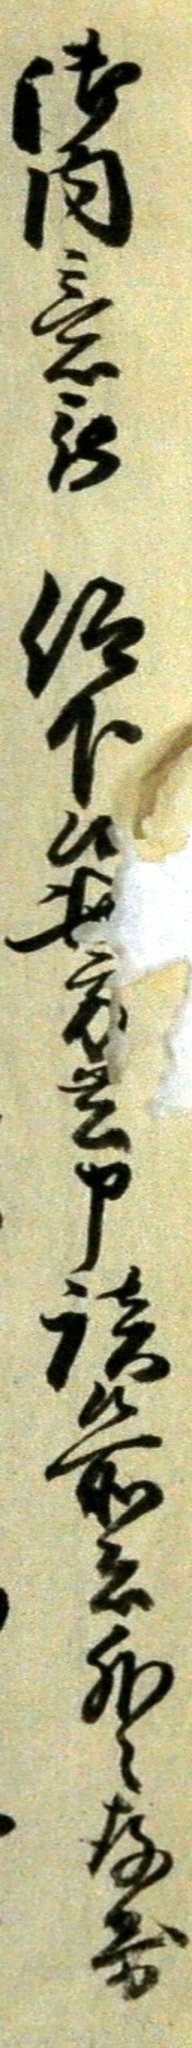御内意被仰下候此方共申談候所者外々存寄
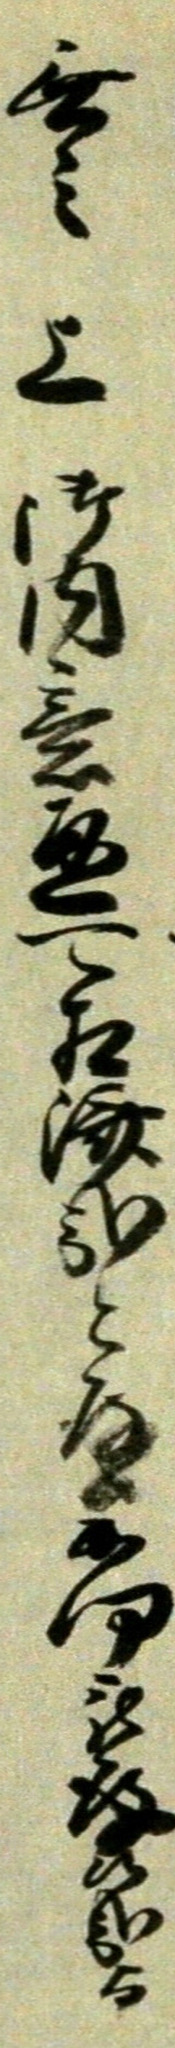無之上御内意通可相済哉と存候如何被存候哉と
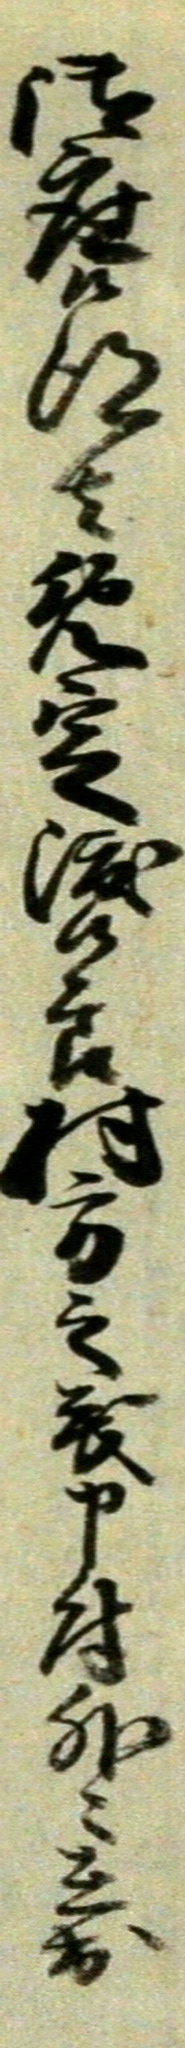御座候得者免定渡候節村方之義申付外々在出
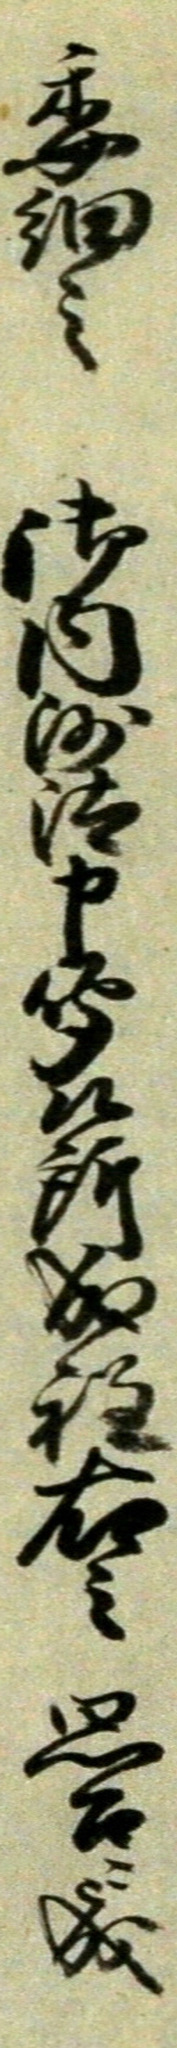委細之御内沙汰申聞候所成程右之思召ニ被成
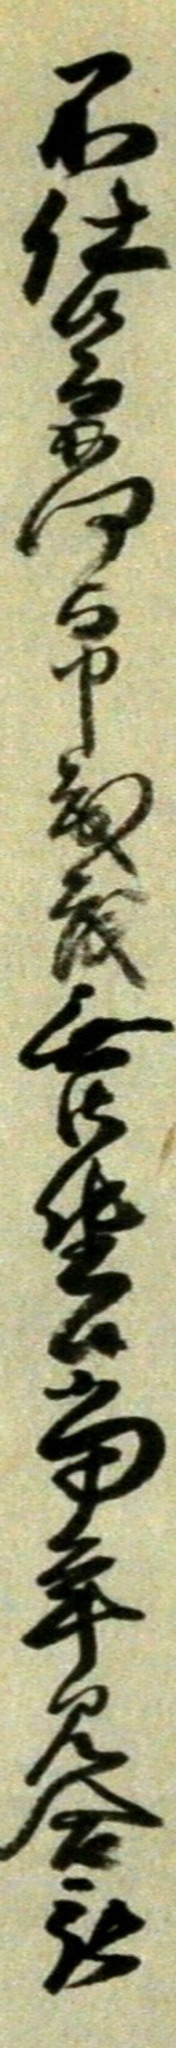不仕候而如何と申義茂無御座候当年見合被
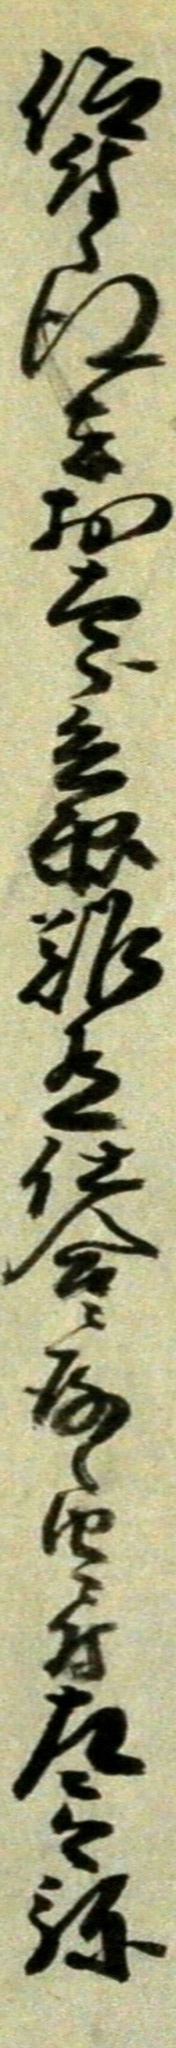仰付候得者於太郎兵衛難有仕合ニ存候由ニ付左候ハヽ弥
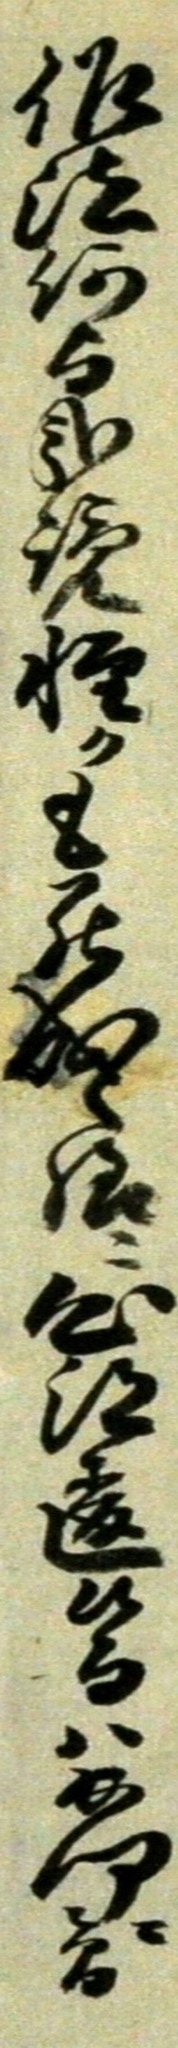作法何哉覧軽クも罷成候様ニ心得違候而ハ如何ニ候間
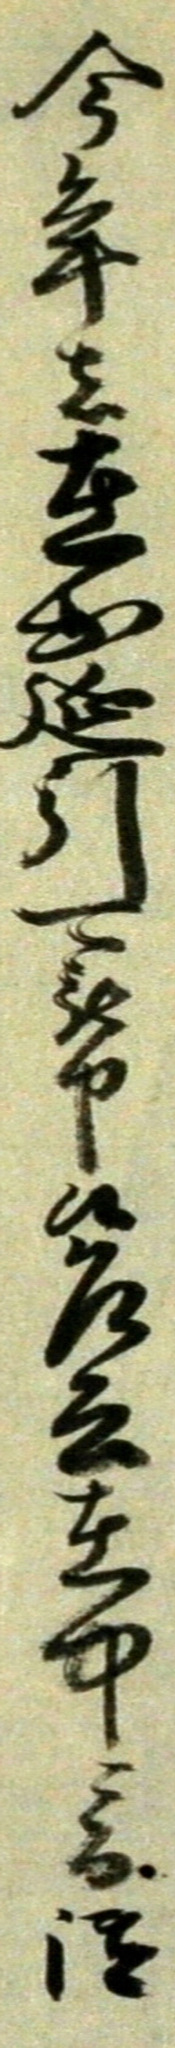今年者在出延引可被申候乍去在中ニ而御
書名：留書
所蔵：伊那市立高遠町図書館・合同会社AMANE
